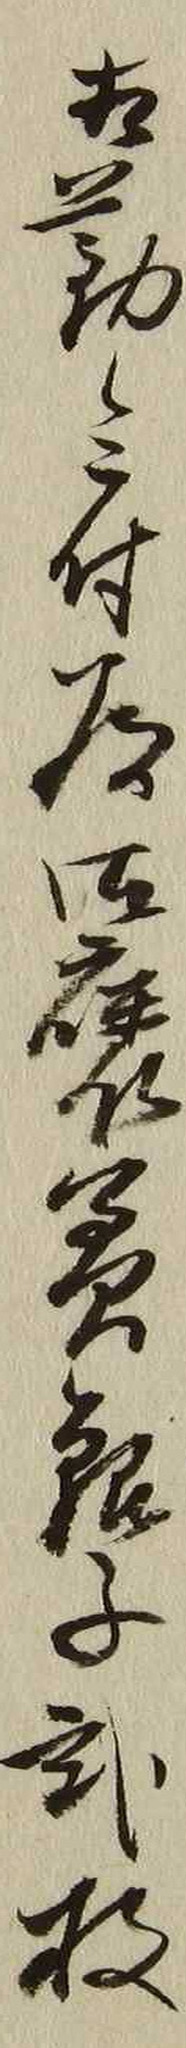相勤候ニ付為御褒美銀子弐枚
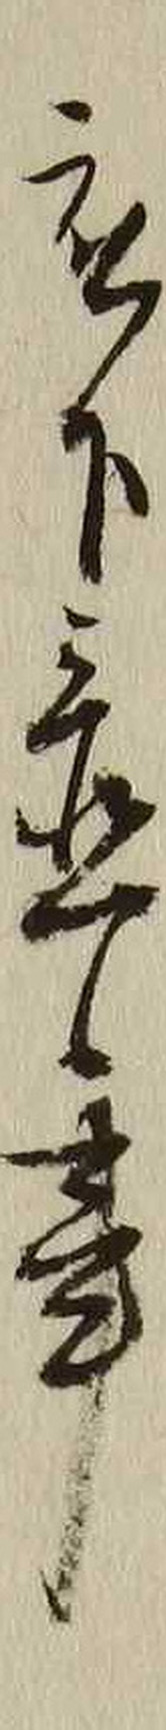被下置候事
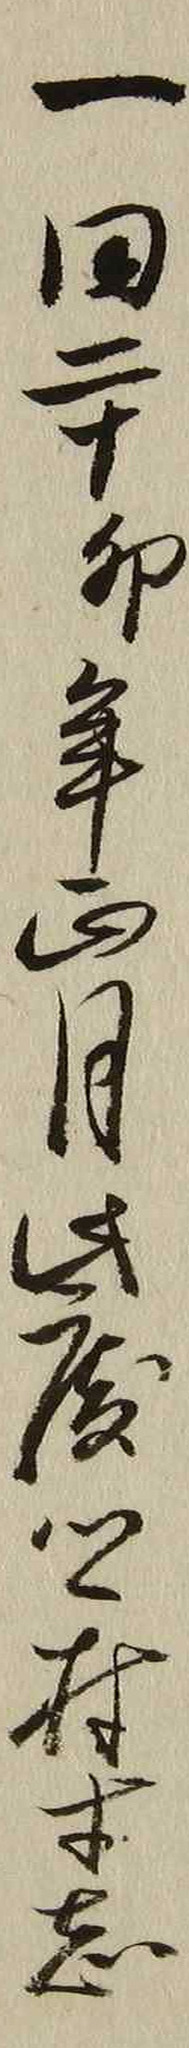一同二十卯年正月此度郷村寸志
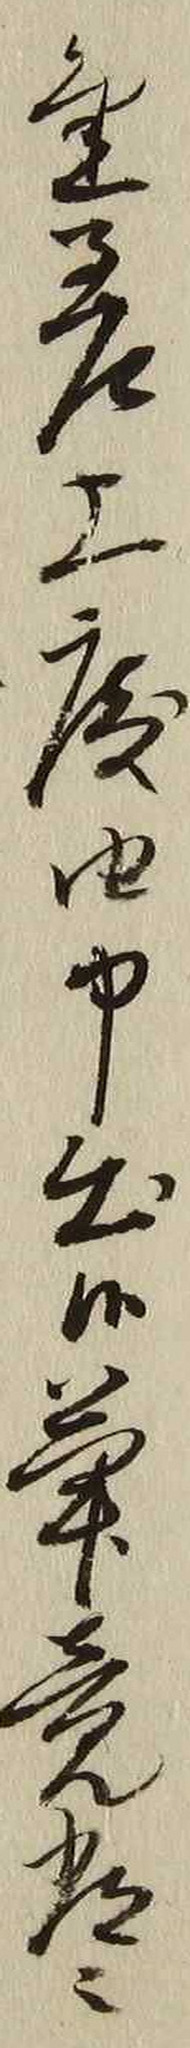金差上度由申出候畢竟常々
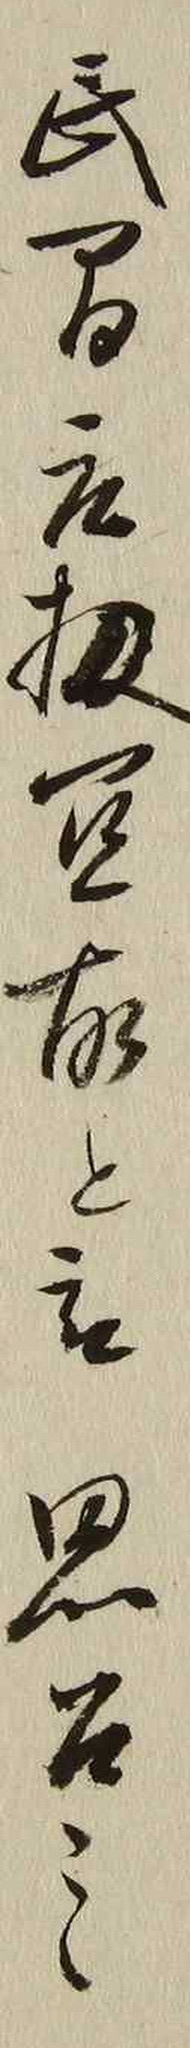民間取扱宜故と被思召之
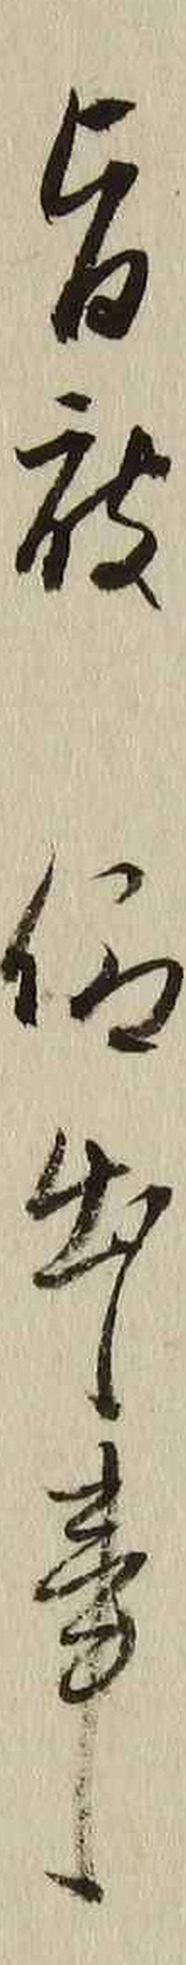旨被仰出候事
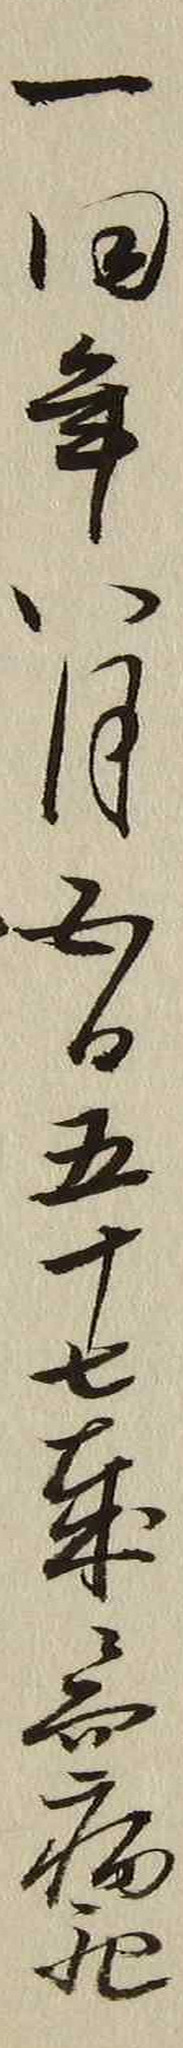一同年八月五日五十七歳ニ而病死
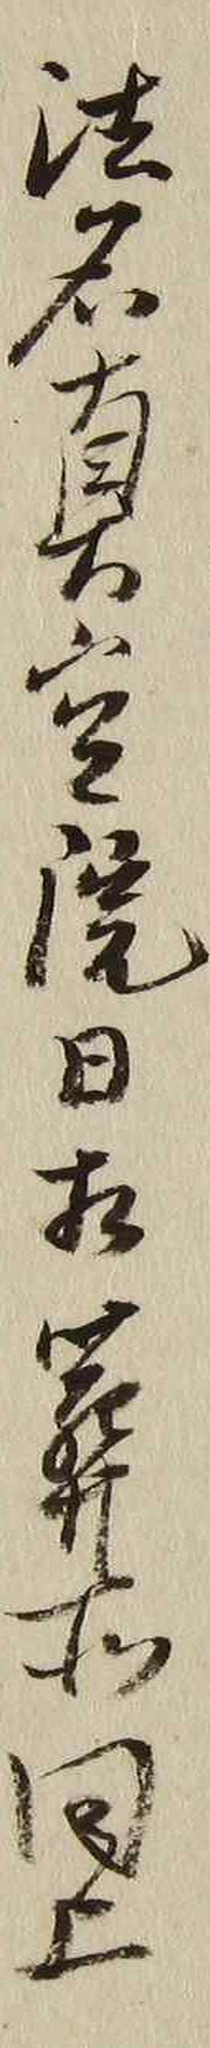法名真空院日相葬所同上
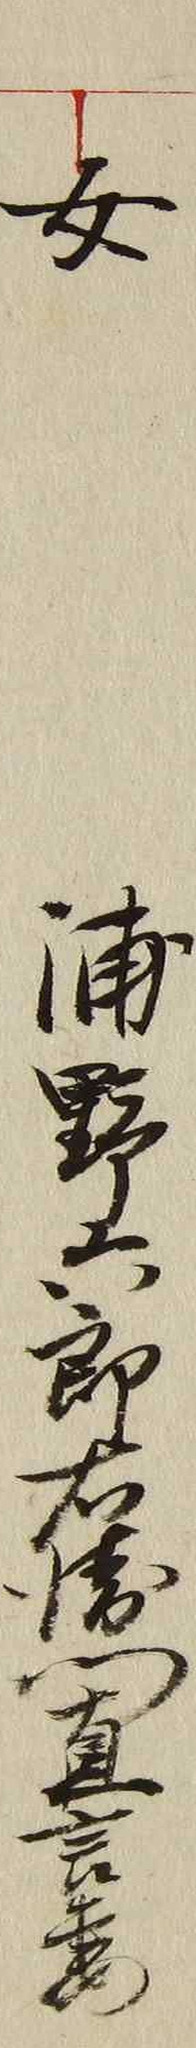女浦野六郎右衛門真言妻
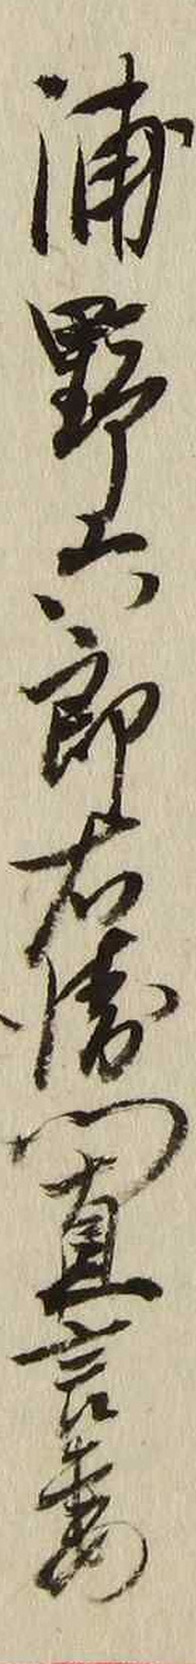女浦野六郎右衛門真言妻
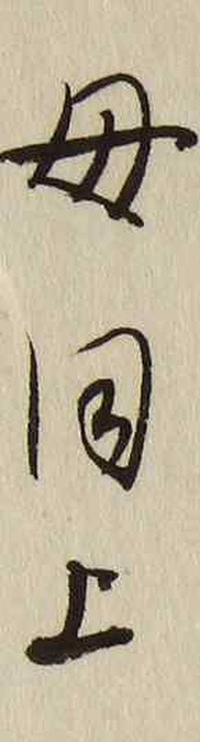母同上

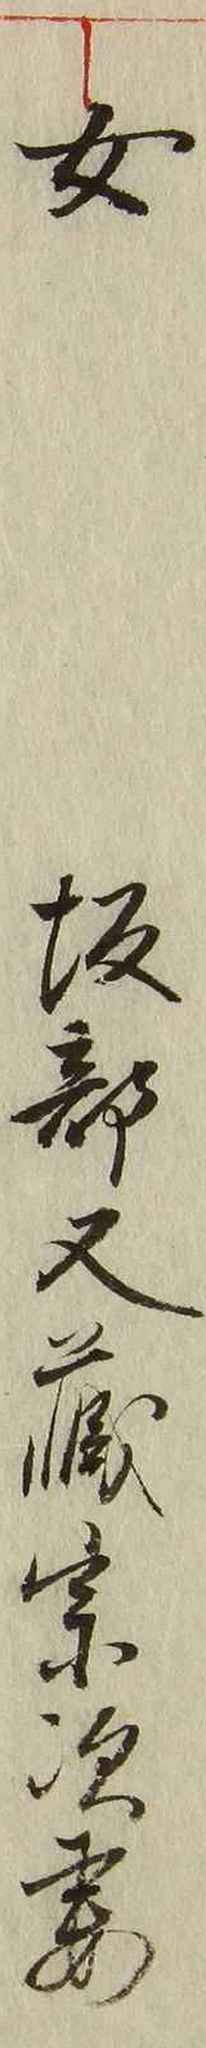女坂部又蔵宗次妻
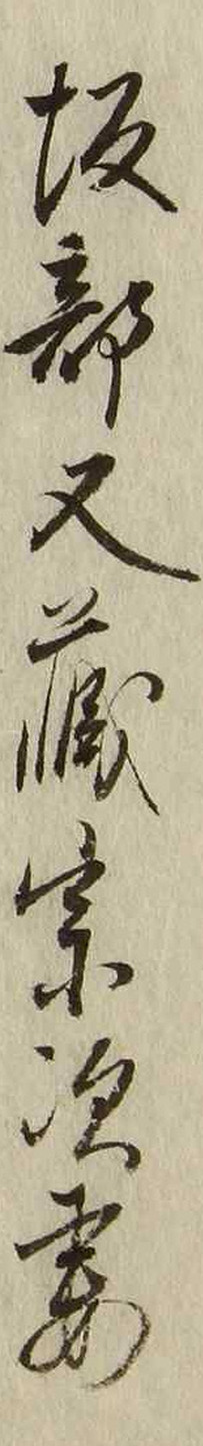女坂部又蔵宗次妻
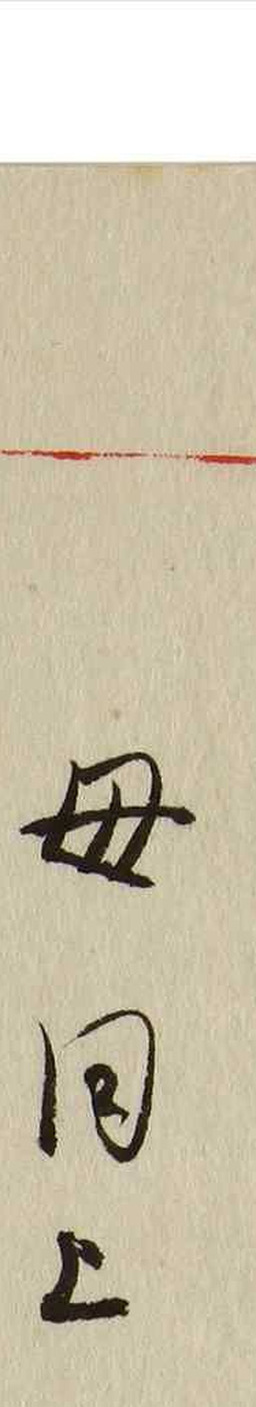母同上
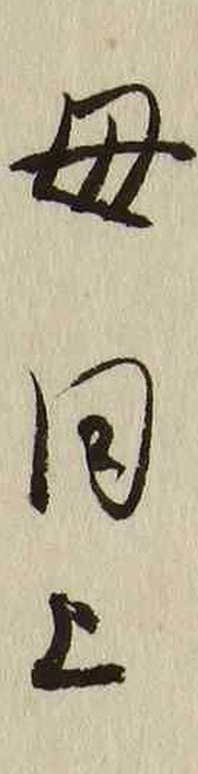母同上
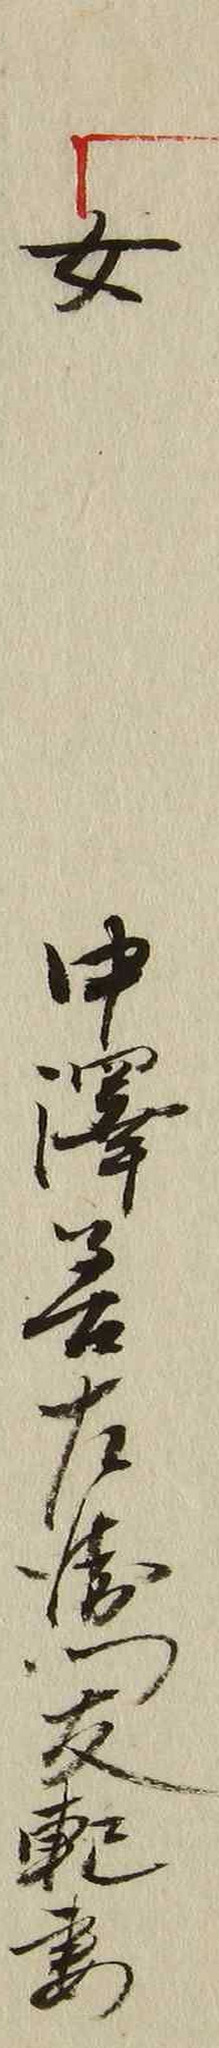女中沢善左衛門友範妻
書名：諸士系譜　巻之352　す之部2
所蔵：会津若松市立会津図書館
